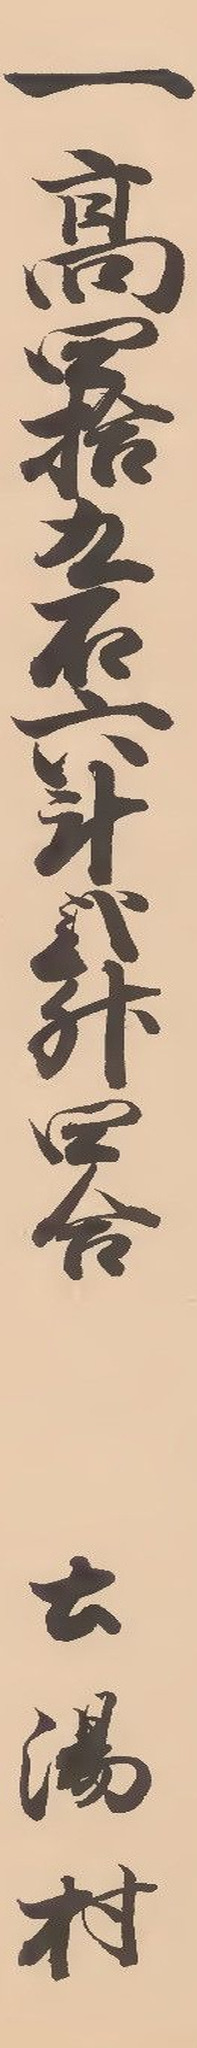一高四拾九石六斗弐升四合土湯村
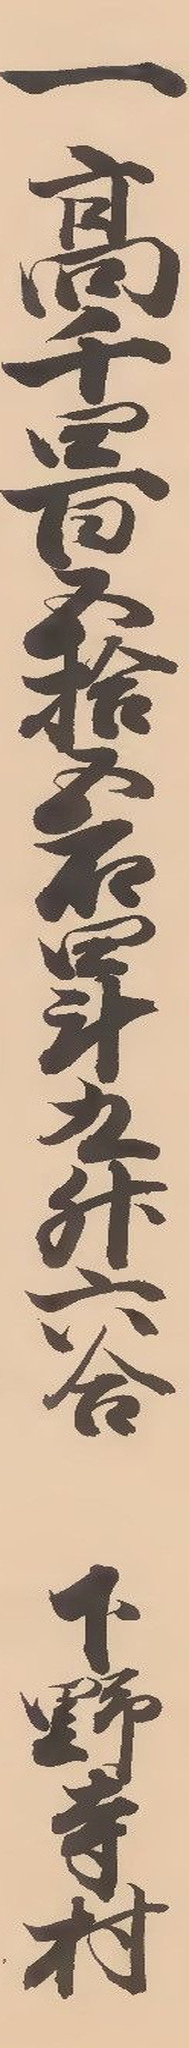一高千四百五拾五石四斗九升六合下野寺村
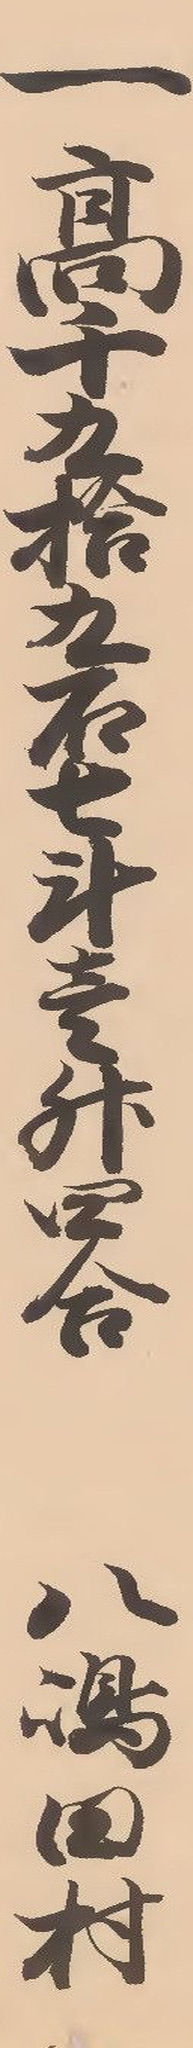一高千九拾九石七斗壱升四合八島田村
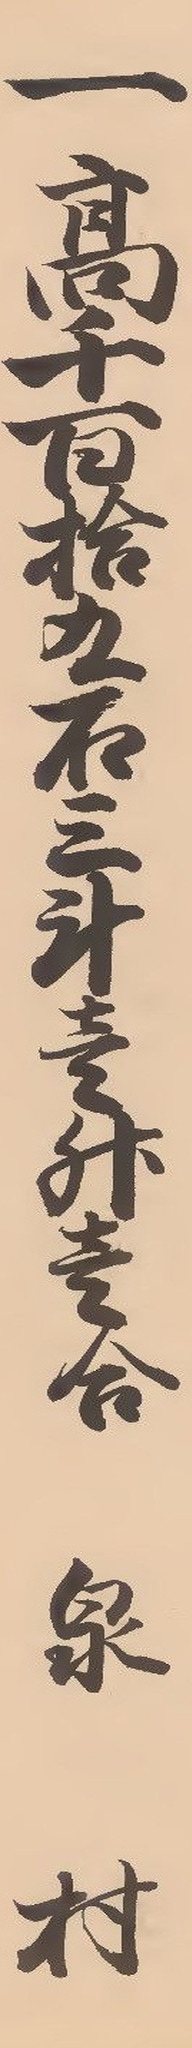一高千百拾九石三斗壱升壱合泉村

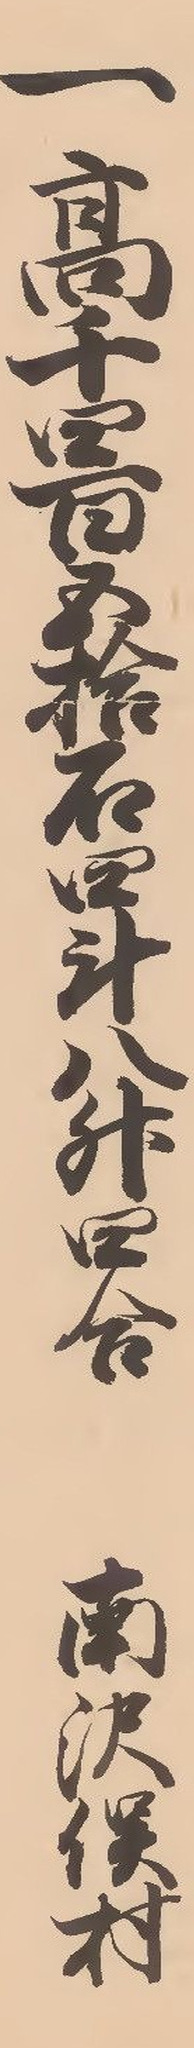一高千四百五拾石四斗八升四合南沢俣村
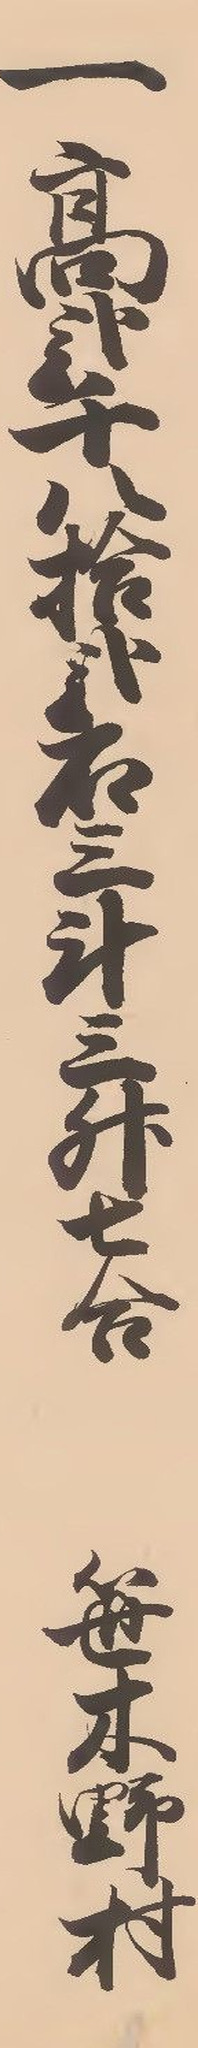一高弐千八拾弐石三斗三升七合笹木野村
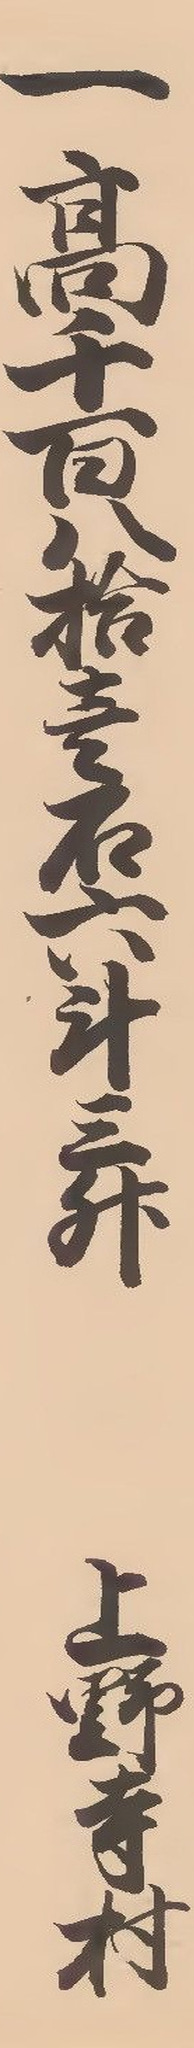一高千百八拾壱石六斗三升上野寺村
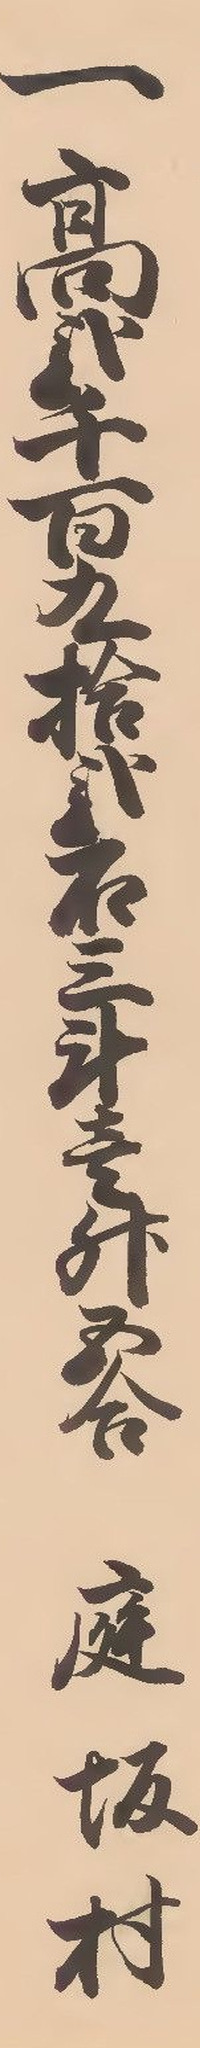一高弐千百九拾弐石三斗壱升五合庭坂村
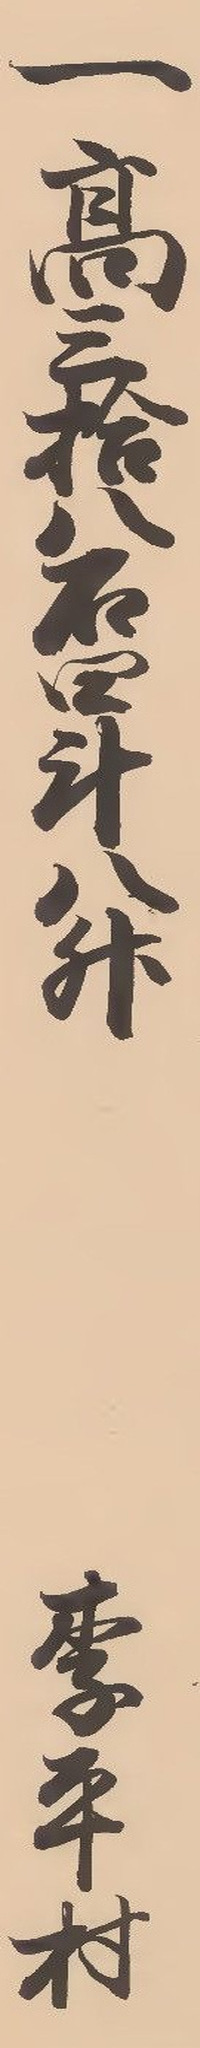一高三拾八石四斗八升李平村
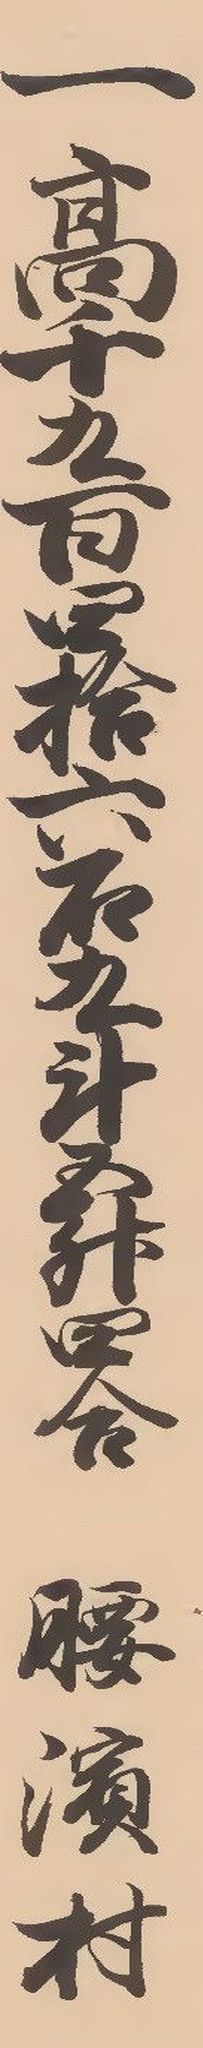一高千九百四拾六石九斗五升四合腰浜村
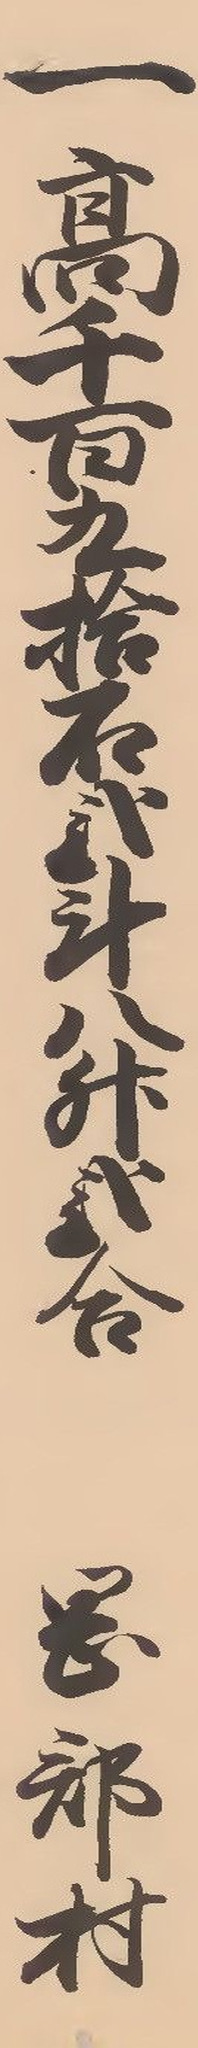一高千百九拾石弐斗八升弐合岡部村
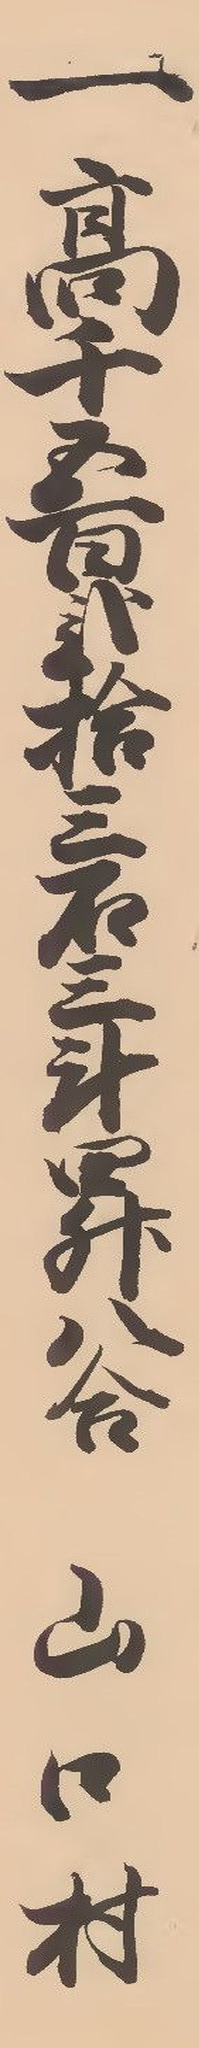一高千五百弐拾三石三斗四升八合山口村

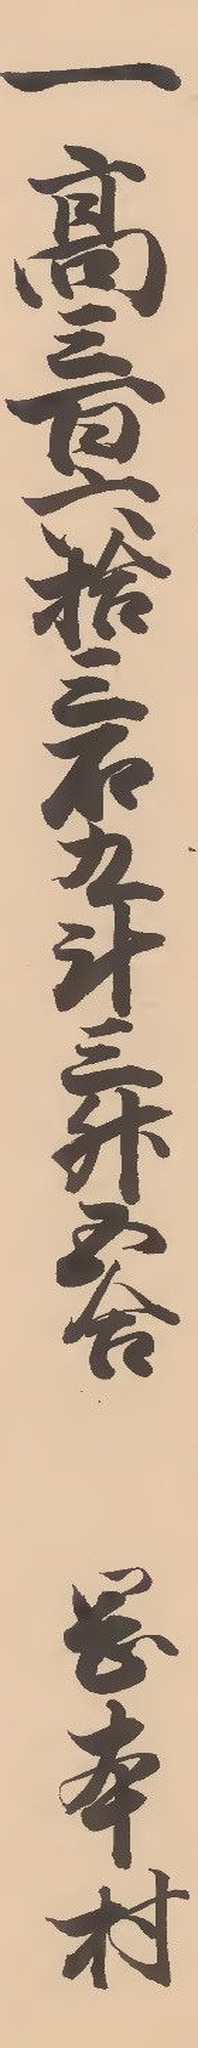一高三百六拾三石九斗三升五合岡本村
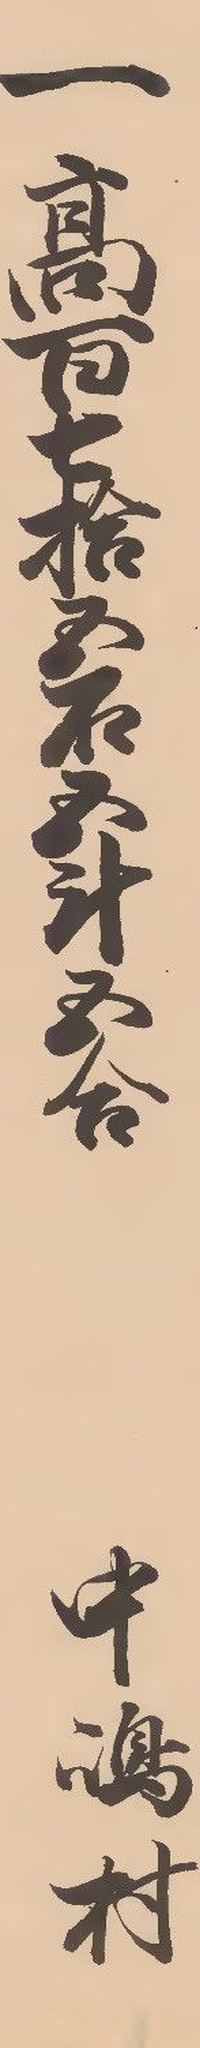一高百七拾五石五斗五合中島村
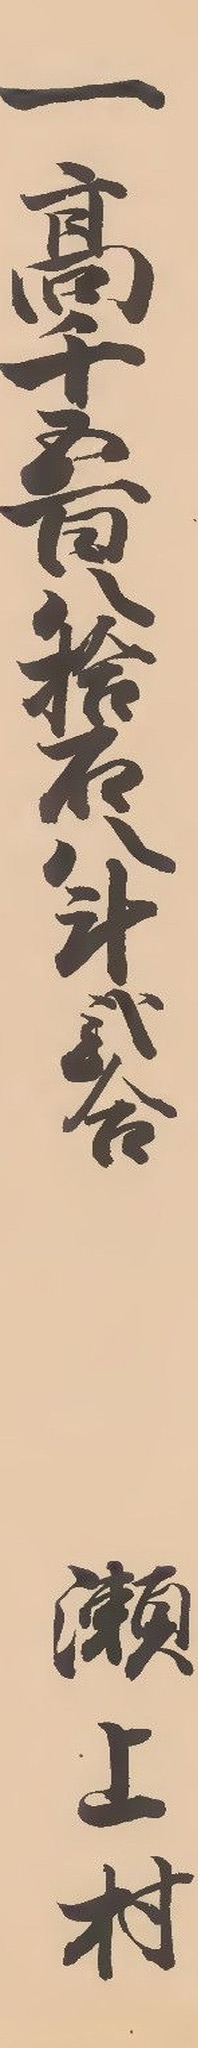一高千五百八拾石八斗弐合瀬上村
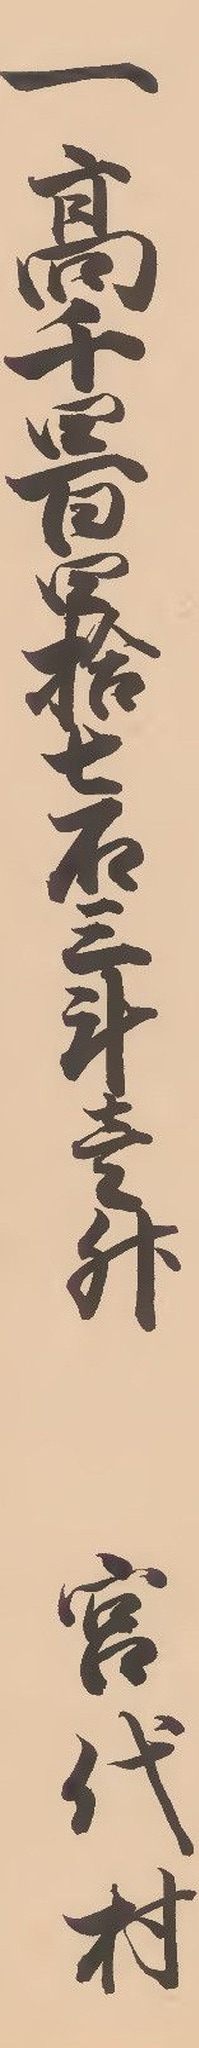一高千四百四拾七石三斗壱升宮代村
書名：陸奥国郷帳　４
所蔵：国立公文書館 National Archives of Japan
